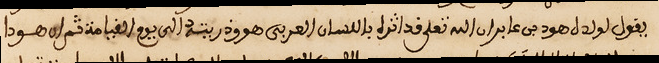يقول لواده هود بن عابر ان الله تعلى قد اثره بالسان العربى هو وذريته الى يوم القيامة ثم ان هودا
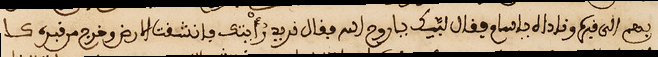بهم الى قبره وناداه يا سام فقال لبيك ياروح الله فقال نريد رايتك فانشقت الارض وخرج من قبره كا
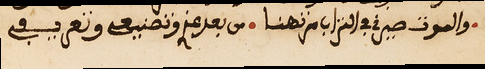والموت صيرني في التراب مرتهنا من بعد عزى وتصنيفى وتعريفى
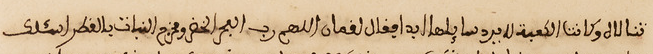تنالاه وكانت الكعبة لا يرد سائلها ابدا فقال لقمان اللهم رب البحر الحضر ومخرج البنات بالقطر اسئلك
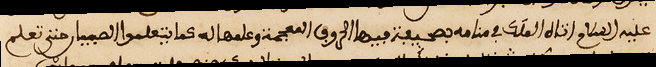عليه السلام اتاه الملك في منامه بصحيفة فيها الحروف المعجمة وعلمها له كما يتعلموا الصبيان حتى تعلم
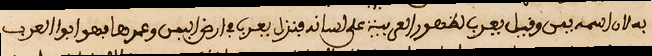به لان اسمه يمن وقيل يعرب لظهور العربية على لسانه فنزل يعرب في ارض اليمن وعمرها فهو ابو العرب
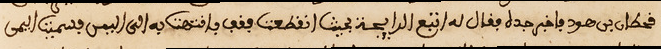قحطان بن هود فاخبر جده فقال له اتبع الرائحة بحيث انقطعت فقف فانتهت به الى اليمن فسميت اليمن
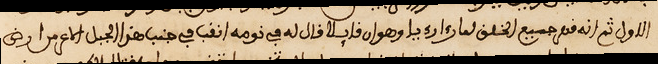الاول ثم انه قهر جميع الخلق لما رءا رءيا وهو ان قائلا قال له في نومه انقب في جنب هذا الجبل الاعرمن ارض
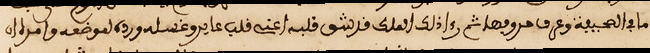ما في الصحيفة وعرف حروفها ثم رءا ذلك الملك قد شق قلبه اعنى قلب عابر وغسله ورده لموضعه وامر ان
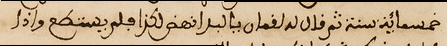خمسماية سنة ثم قال له لقمان يا لبر انهض لكذا فلم يستطع واذا
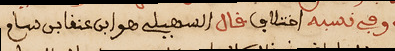وفى نسبه اختلاف قال السهيلى هو ابن عنقا بن سام
